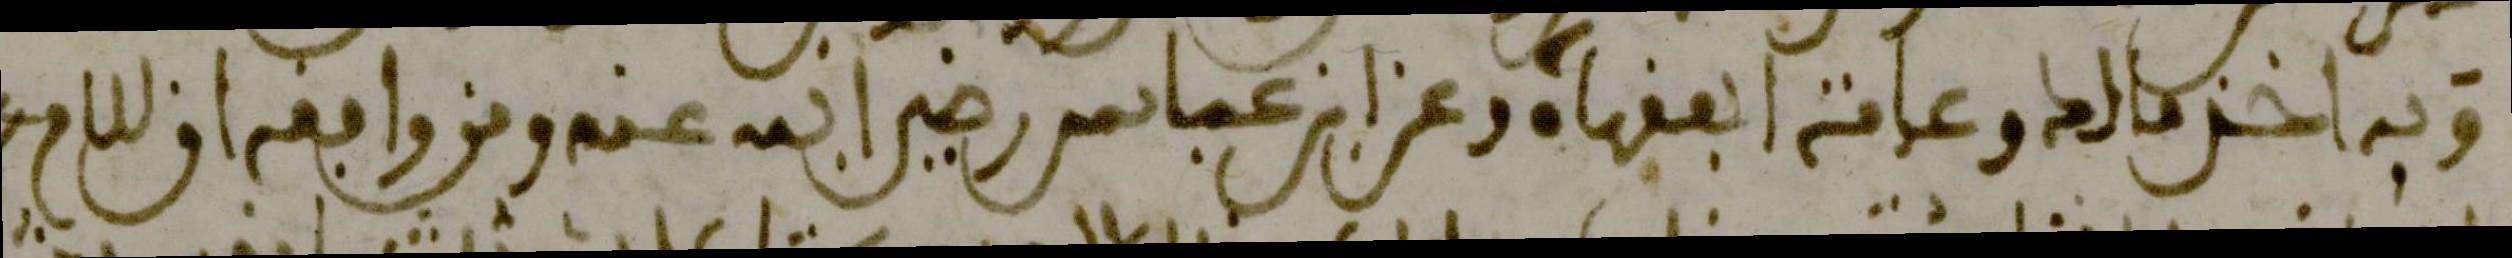وبه اخذ مالك وعامة الفقهاء عن ابن عباس رضي الله عنه ومن وافقه ان للام
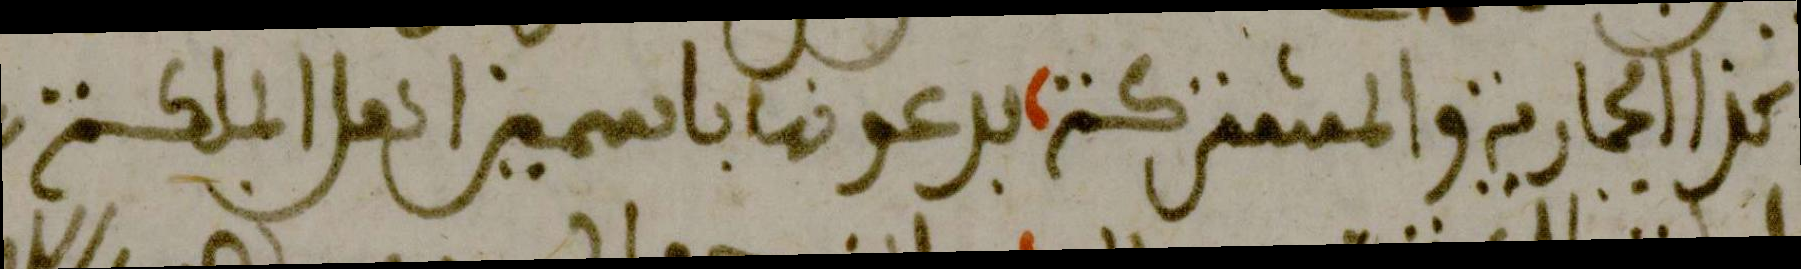كذا الحمارية والمشتركة يدعونها باسمين اهل الملكة
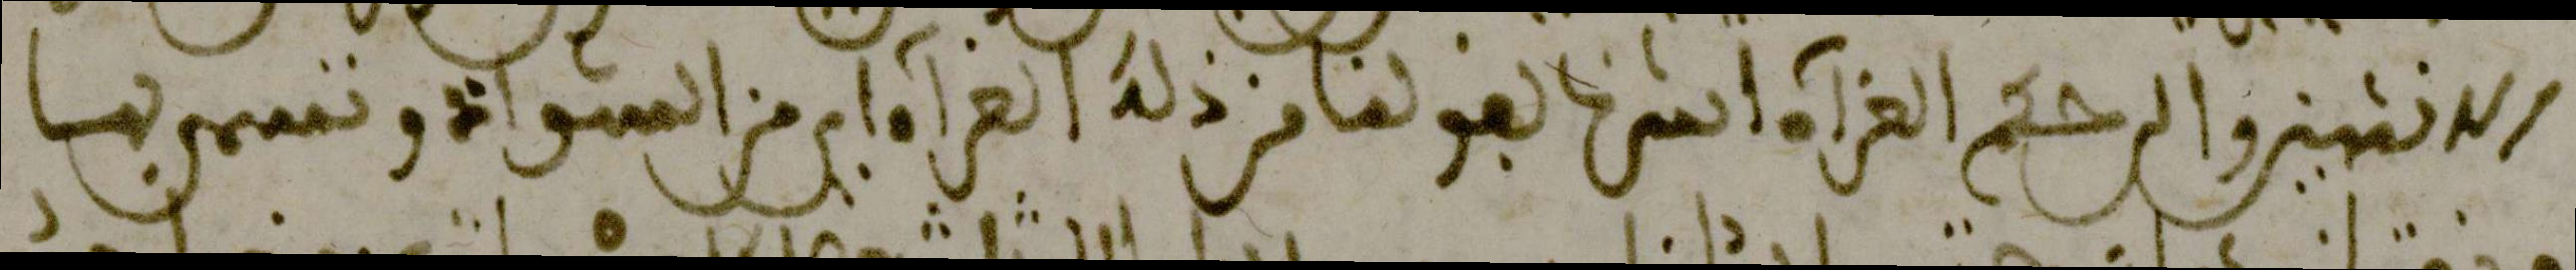الانثيين والى حكم الغراء اشرنا بقولنا من ذلك الغراء اي من الشواذ وتسمى بها
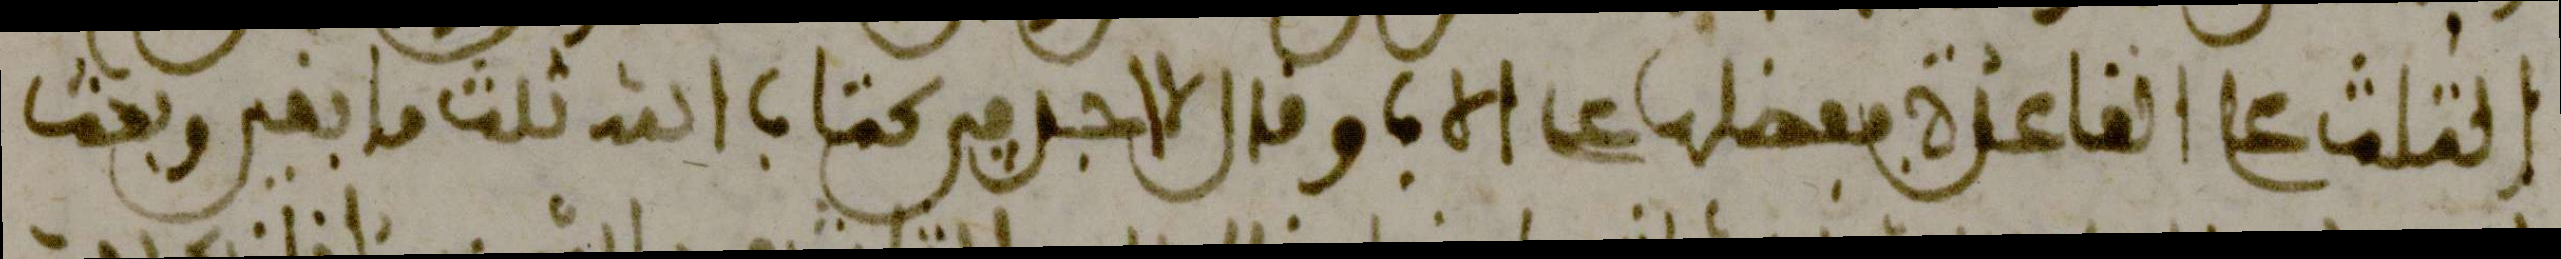الثلث على القاعدة ففضلها على الاب وقال لا اجد في كتاب الله ثلث ما بقي وبعث
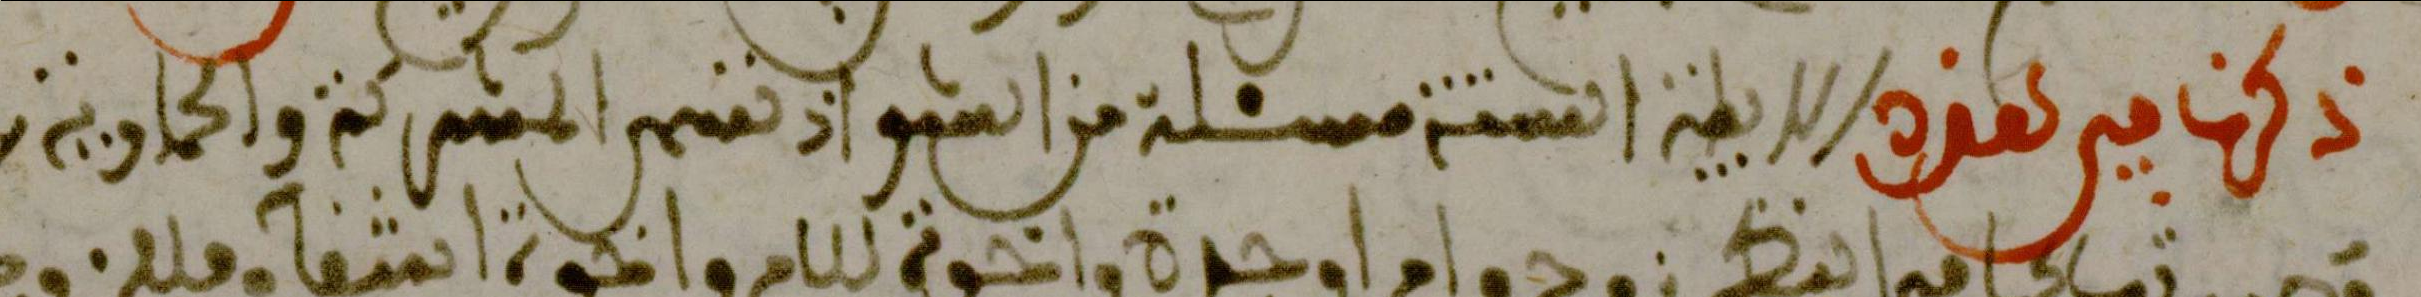ذكرن في هذه الابياة الستة مسئلة من الشواذ تسمى المشتركة والحمارية
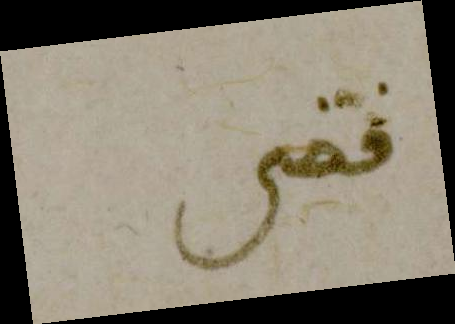قضى
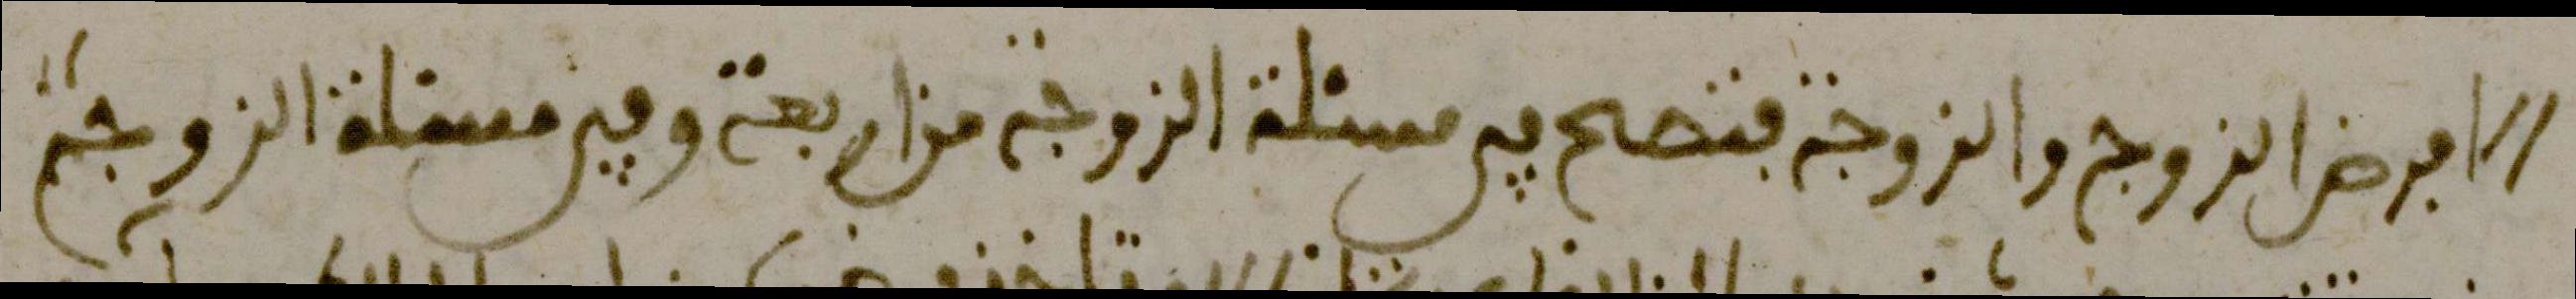الافرض الزوج او الزوجة فتصح في مسئلة الزوجة من اربعة وفي مسئلة الزوج
